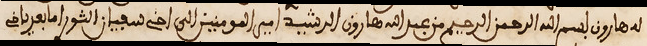له هارون بسم الله الرحمن الرحيم من عبد الله هارون الرشيد امير المومنين الى اخى سفيان الثورى اما بعد ياخى
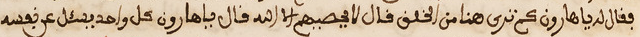فقال له يا هارون كم ترى هنا من الخلق قال لا يحصيهم الا الله قال يا هارون كل واحد يسئل عن نفسه
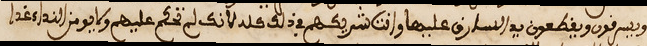ويسرقون ويقطعون يد السارق عليها وانت شريكهم في ذلك كله لانك لم تحكم عليهم ولا يومن النداء غدا
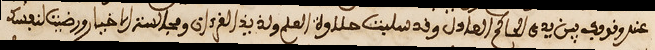عند وقوفك بين يدى الحاكم العادل وقد سلبت حلاوة العلم ولذيذ القرءان ومجالسة الاخيار ورضيت لنفسك
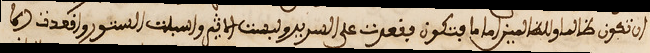ان تكون ظالما وللظالمين اما ما فتكون فقعدت على السريد ولبست الاثير واسبلت الستور واقعدت الا
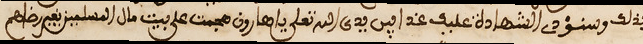بذلك وسنودى الشهادة عليك غدا بين يدى الله تعلى يا هارون هجمت على بيت مال المسلمين بغير رضاهم
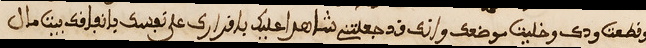وقطعت ودك وخليت موضعك وانك قد جعلتنى شاهدا عليك باقرارك على نفسك فانفاقك بيت مال
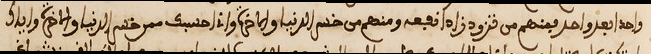واحدا بعد واحد فمنهم من تزود زاد انفعه ومنهم من خسر الدنيا والاخرة وانى احسبك ممن خسر الدنيا والاخر واياك
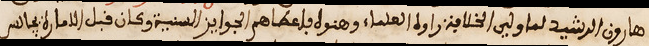هارون الرشيد لما ولي الخلافة زاره العلماء وهنوه فاعطاهم الجوايز السنية وكان قبل الامارة يجالس
